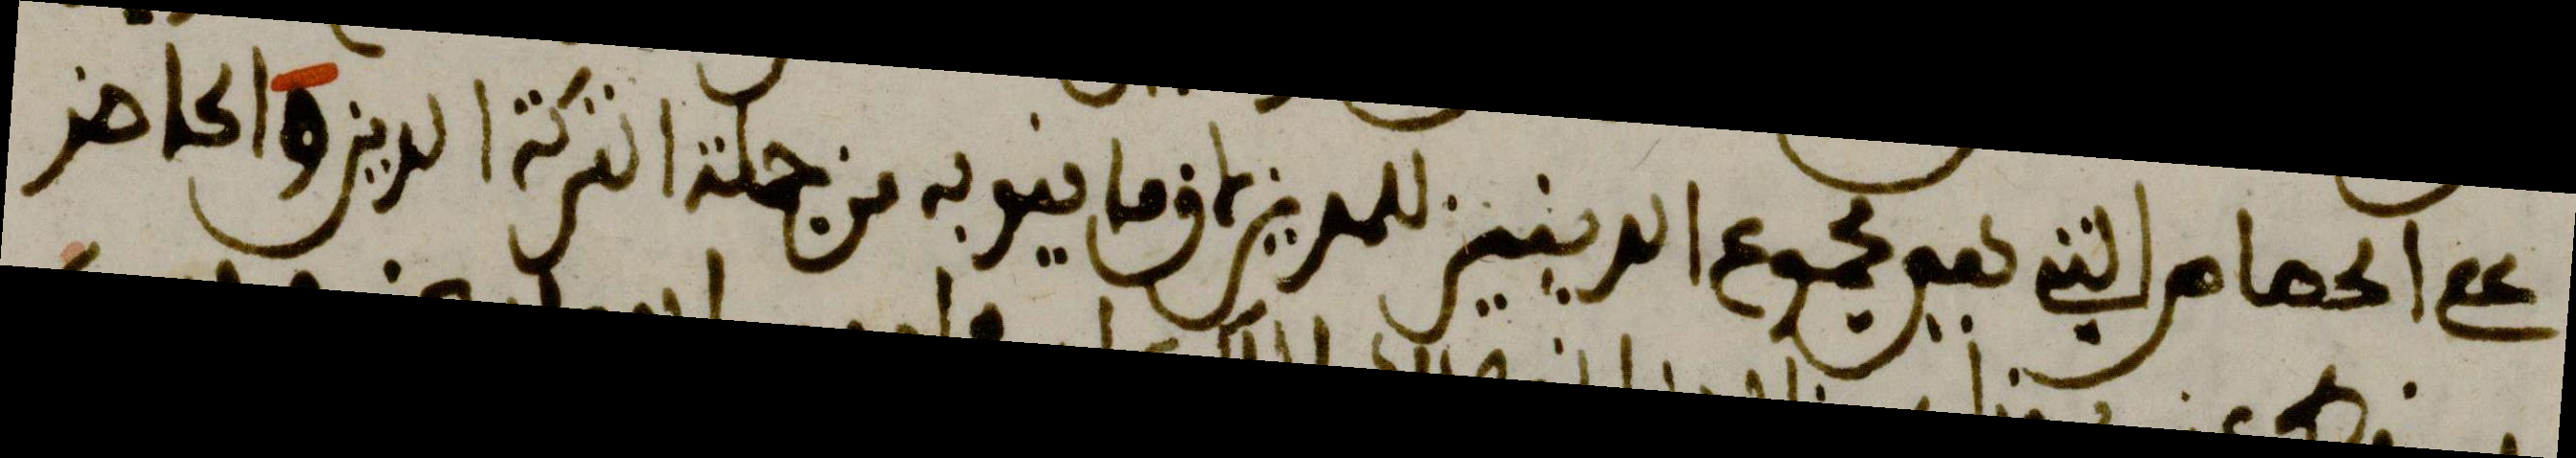على الحصاص التي هي مجموع الينين للمدين لان ما ينوبه من جملة التركة الدين وَالحاضر
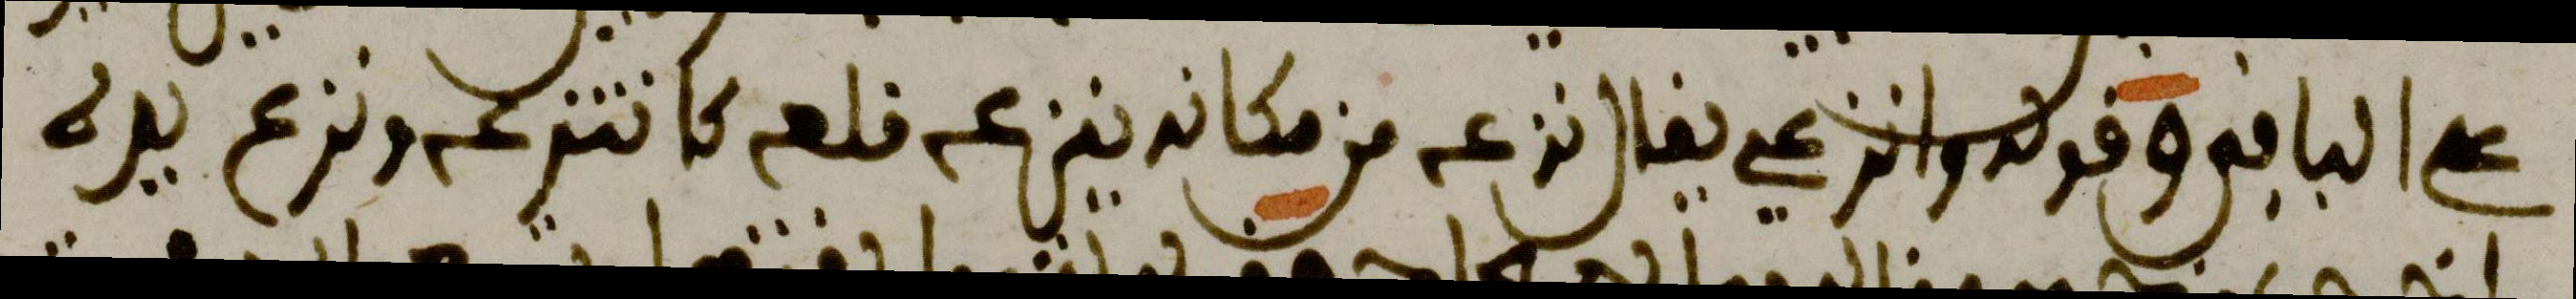على الباقي وَقوله ونزع يقال نزعه من مكانه ينزعه قلعه كانتزعه ونزع يده
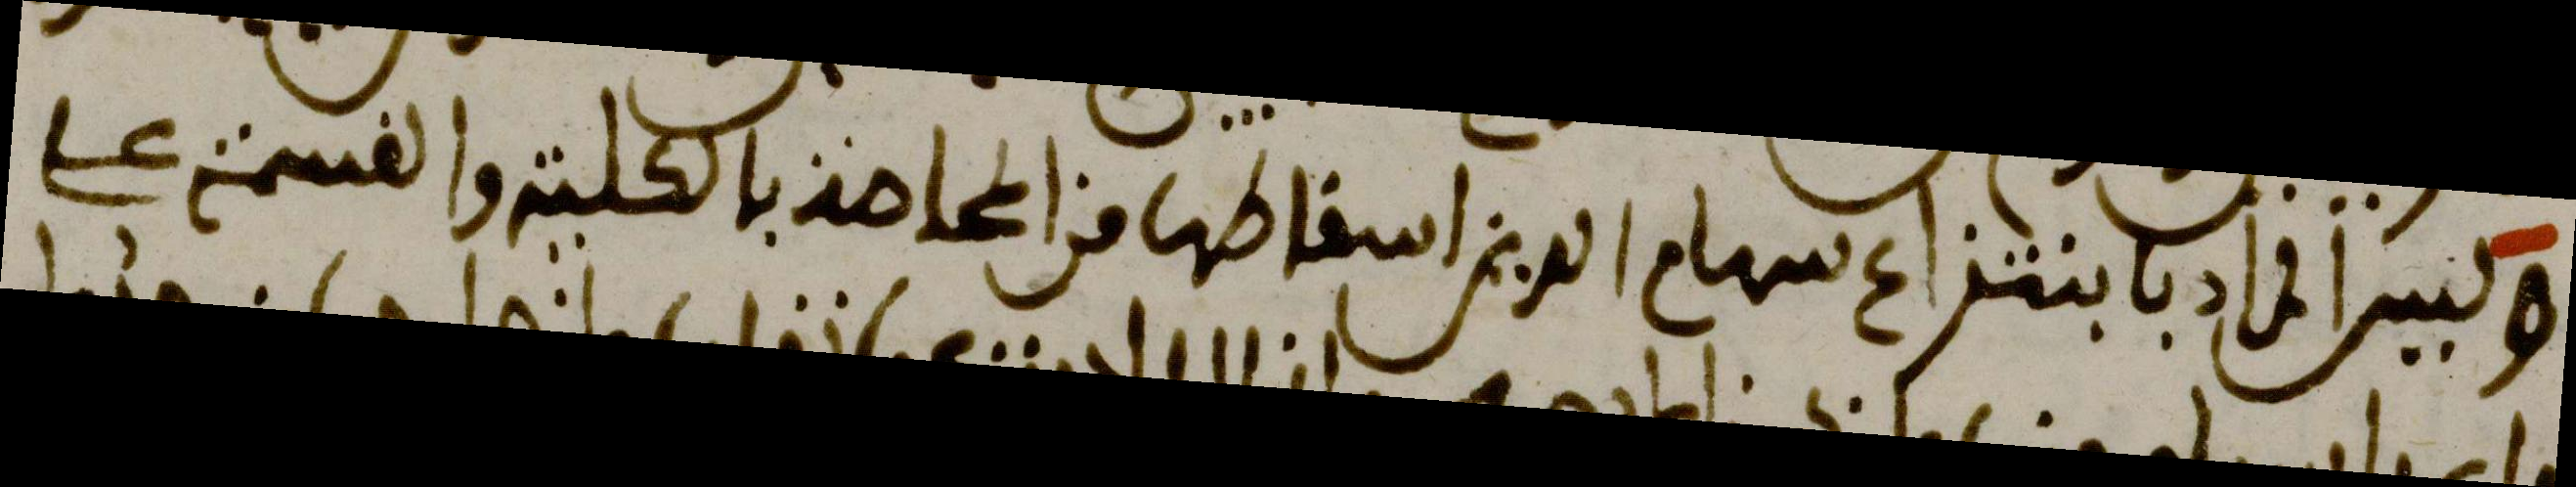وَليس المراد بابنتزاع سهام الدين اسقاطها من المحاصة بالكلية والقسمة على
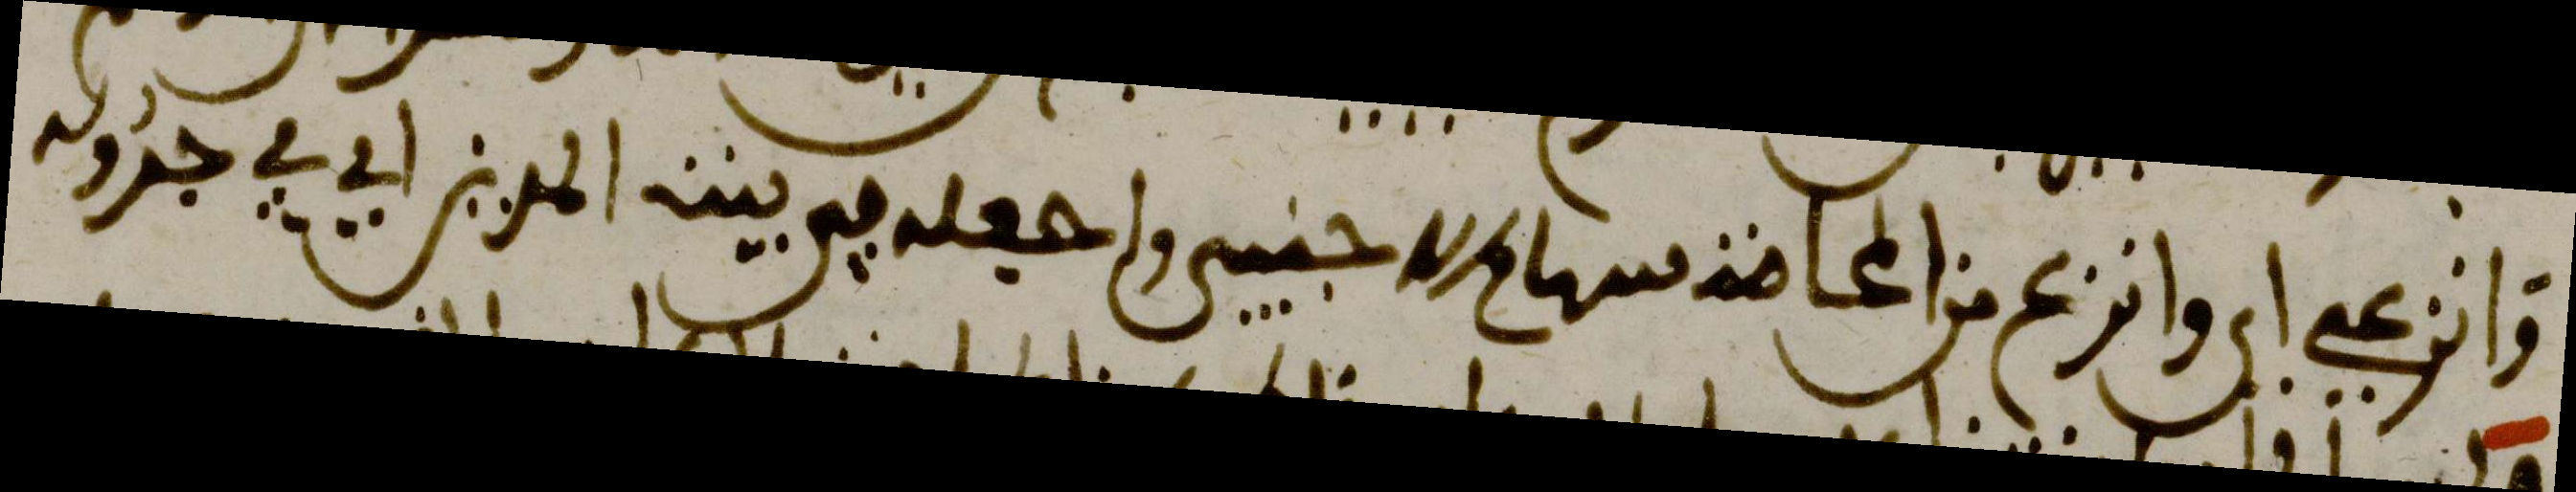وَانزعي اي وانزع من المحاصة سهام الاجنبي واجعله في بيت المدين اي في جدوله
